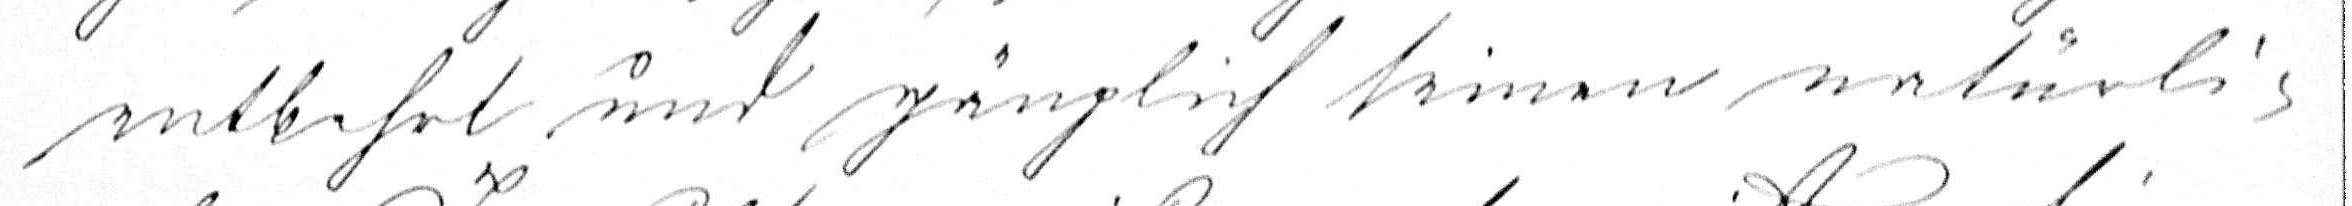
entbehrt und gänzlich seinen natürli¬
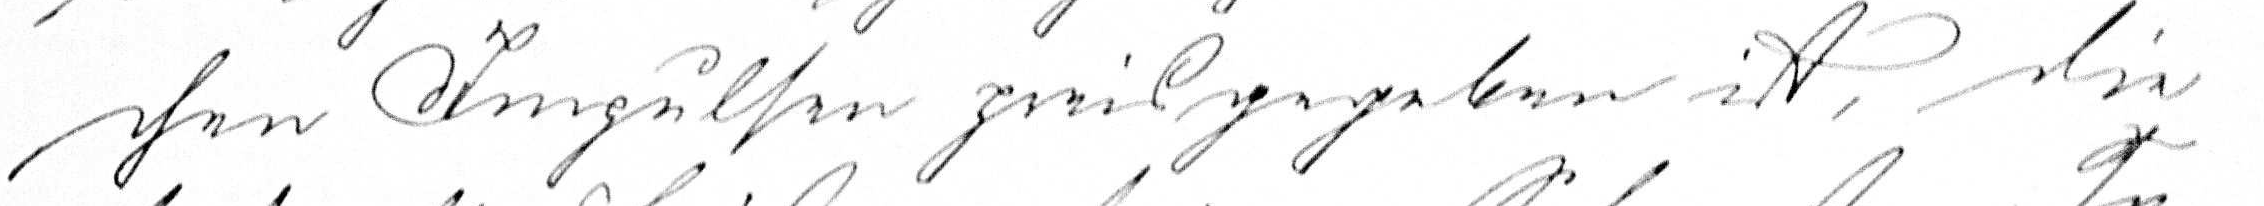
chen Impulsen preisgegeben ist, die
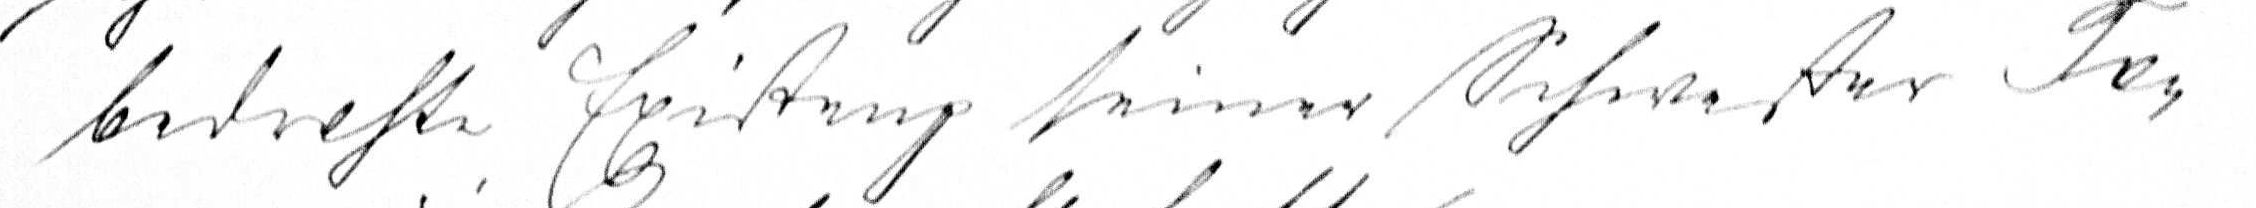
bedrohte Existenz seiner Schwester To¬
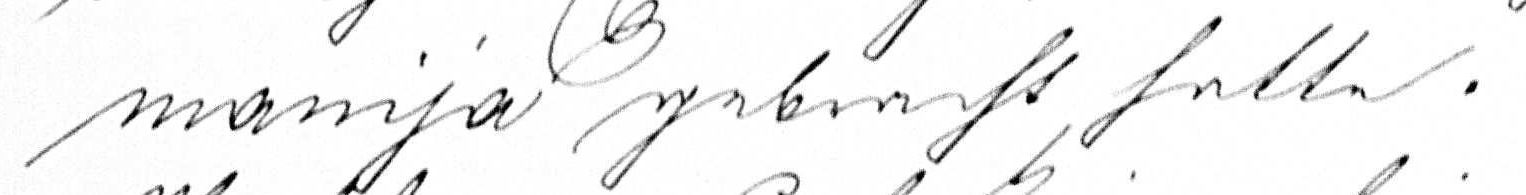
manija gebracht hatte.
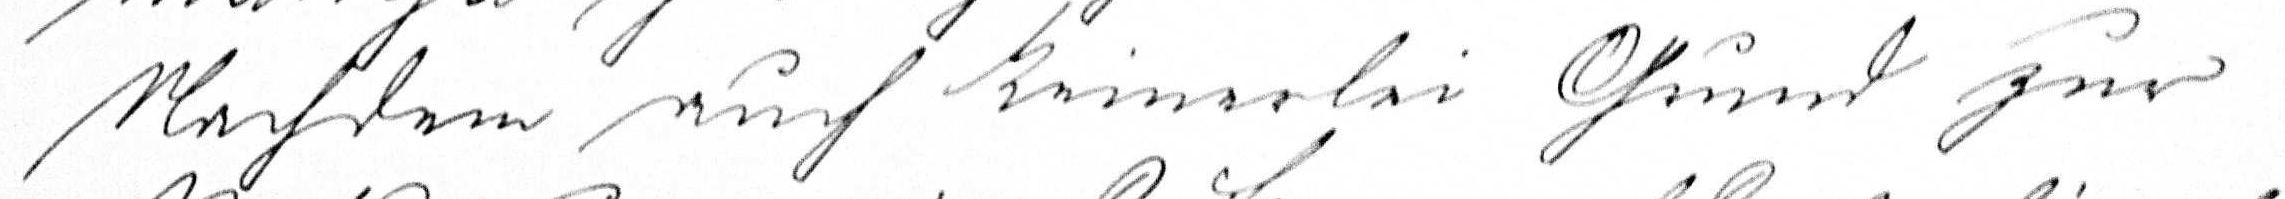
Nachdem auch keinerlei Grund zur
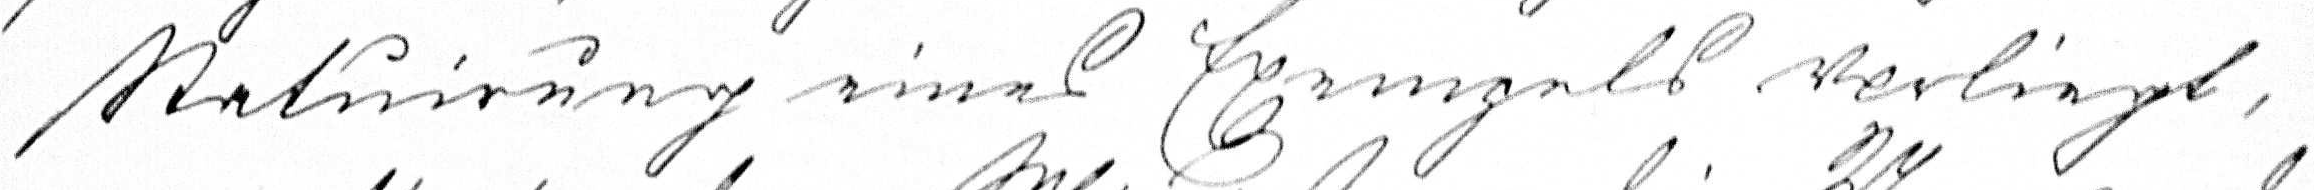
Statuirung eines Exempels vorliegt,
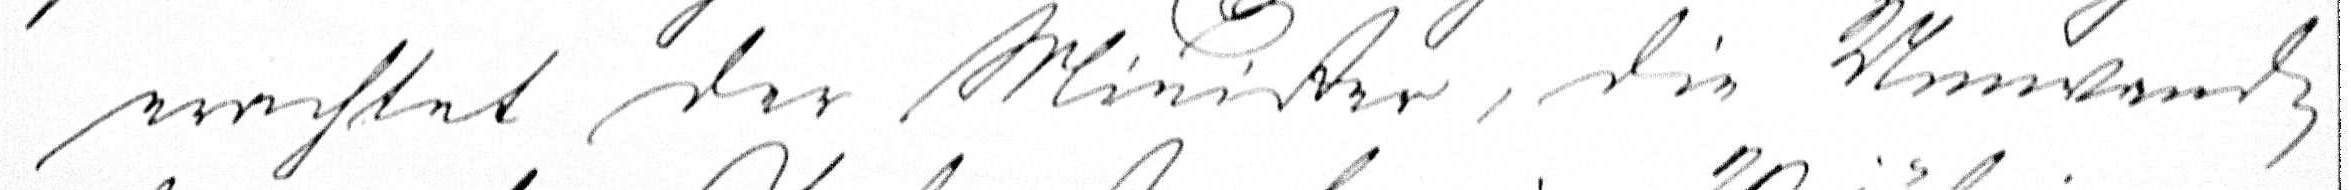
erachtet der Minister, die Umwand¬
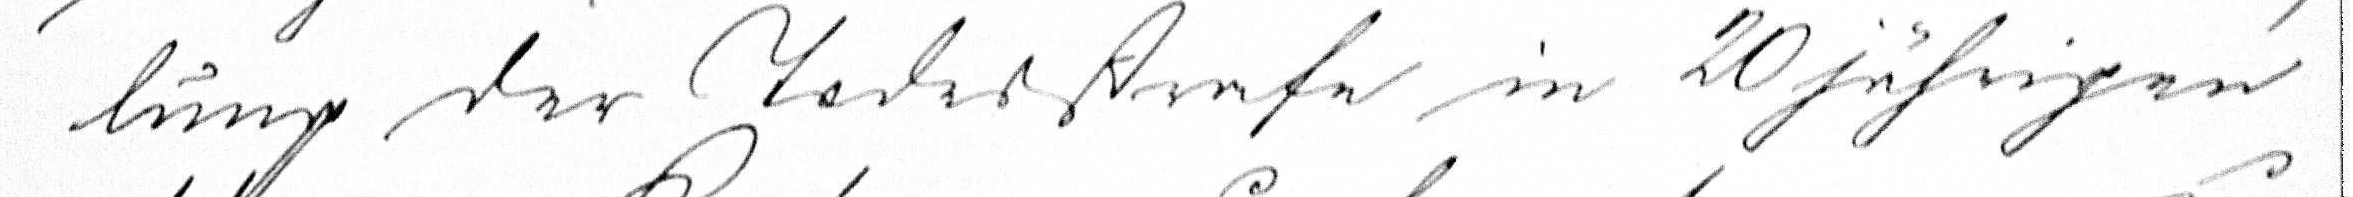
lung der Todesstrafe in 20jährigen
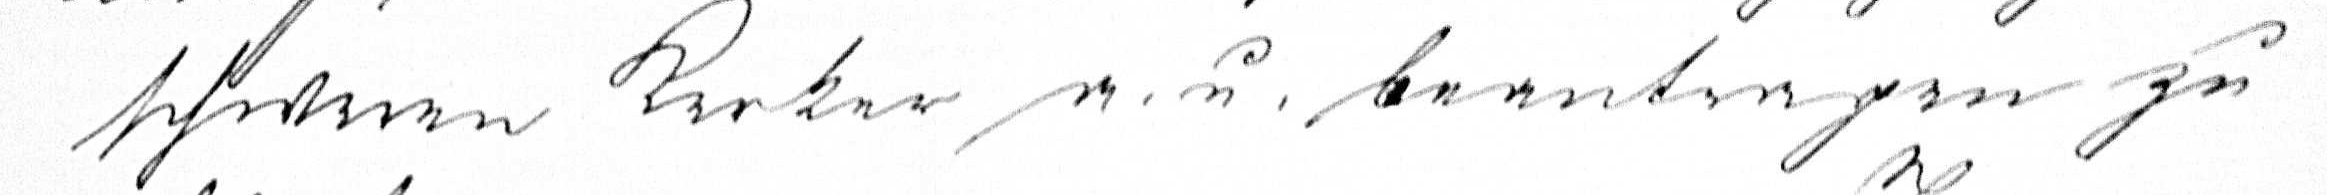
schweren Kerker a.u. beantragen zu
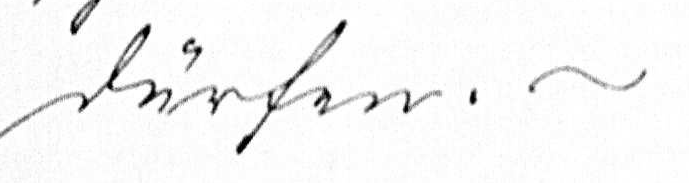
dürfen.
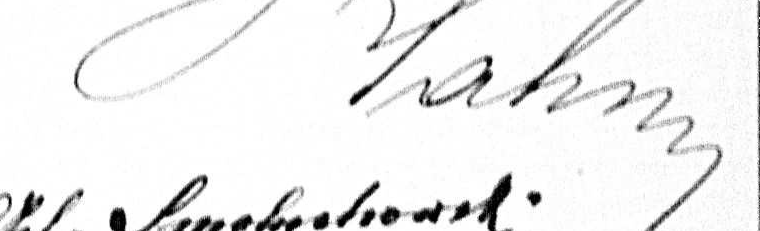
Hahn
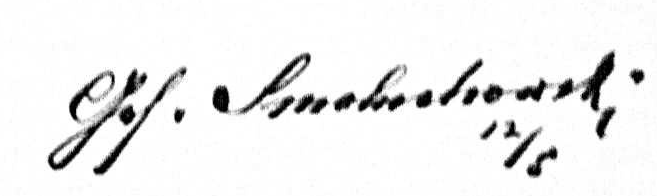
Ges. Smolenkowski
